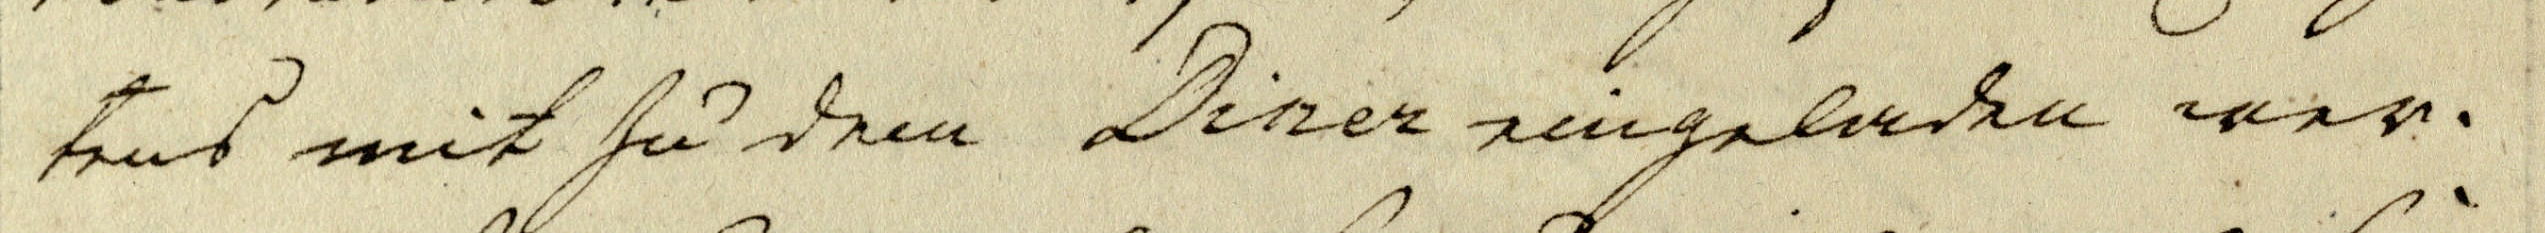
tens mit zu dem Diner eingeladen wer¬
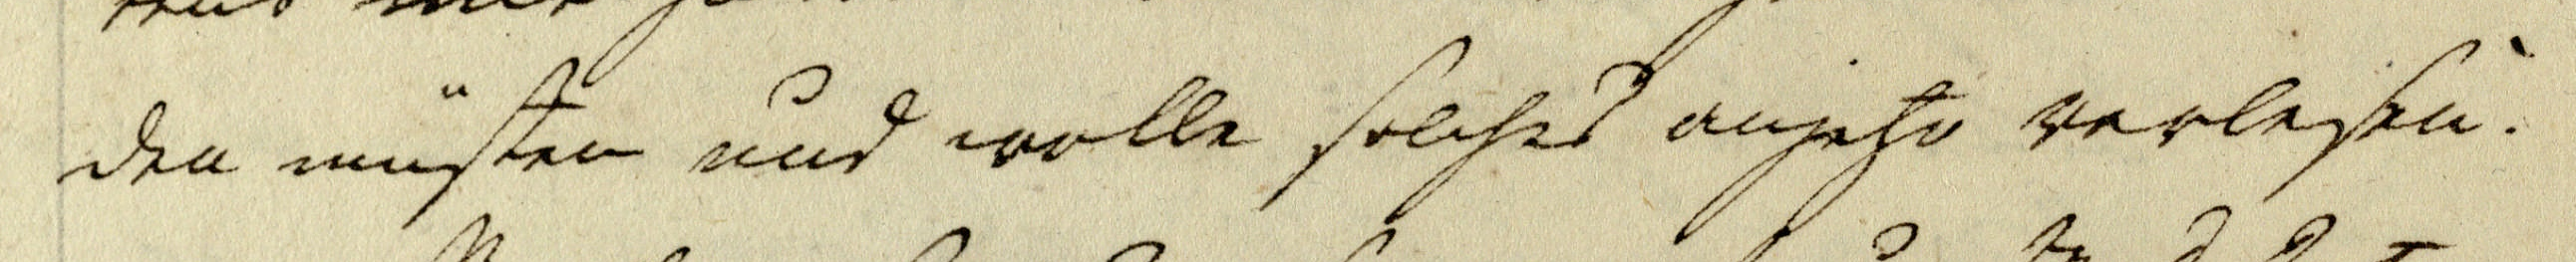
den müßten und wolle solches anjetzo verlesen.
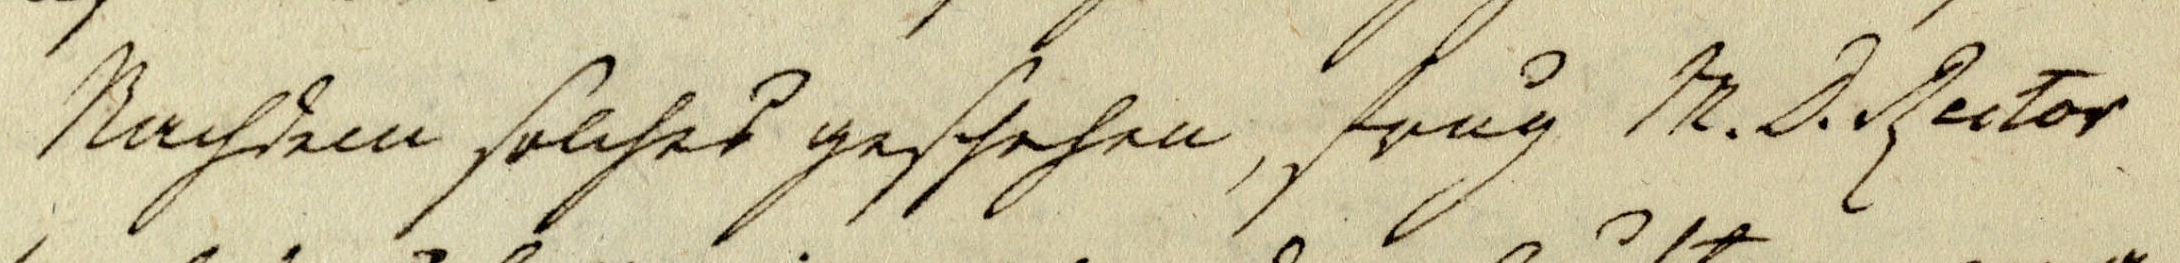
Nachdem solches geschehen, frug M. D. Rector
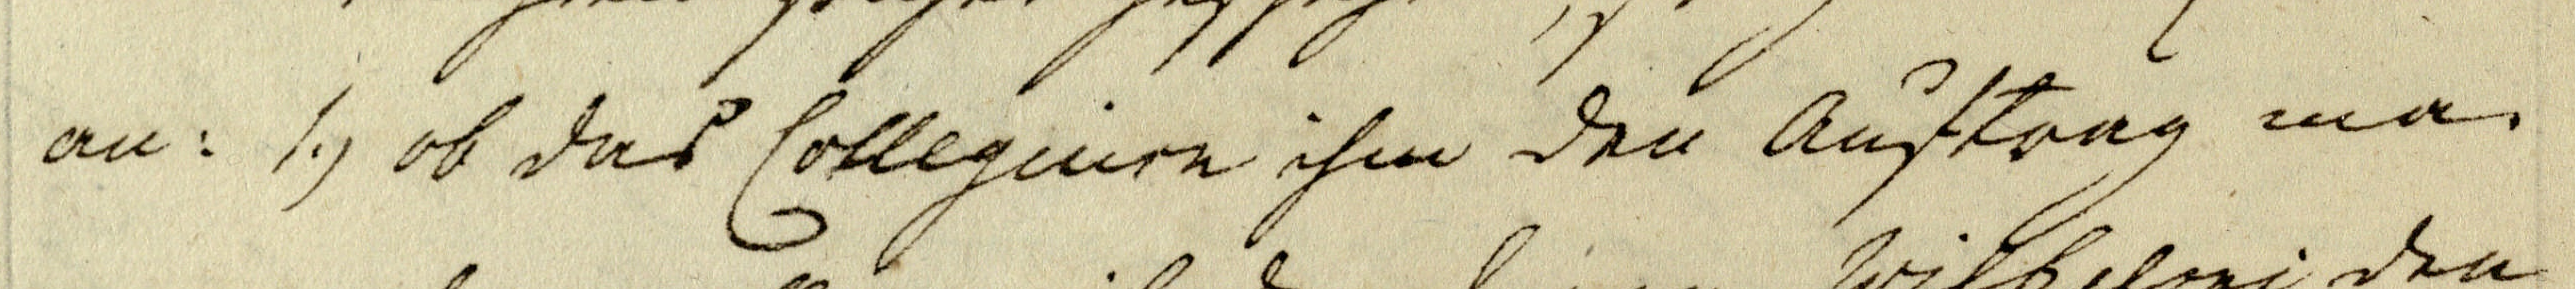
an : 1., ob das Collegium ihm den Auftrag ma¬
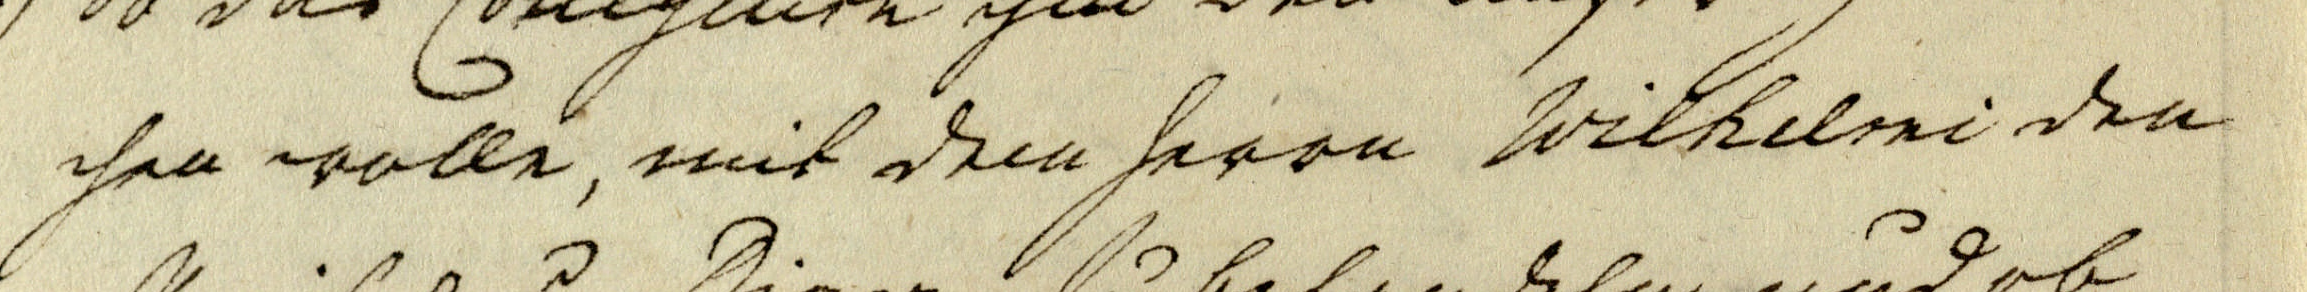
chen wolle, mit dem Herrn Wilhelmi den
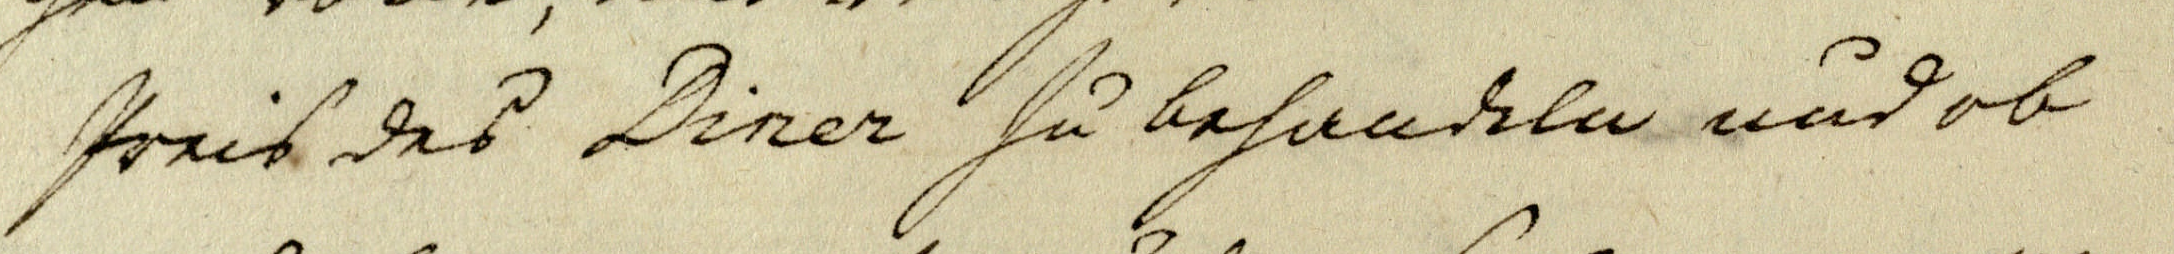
Preis des Diner zu behandeln und ob
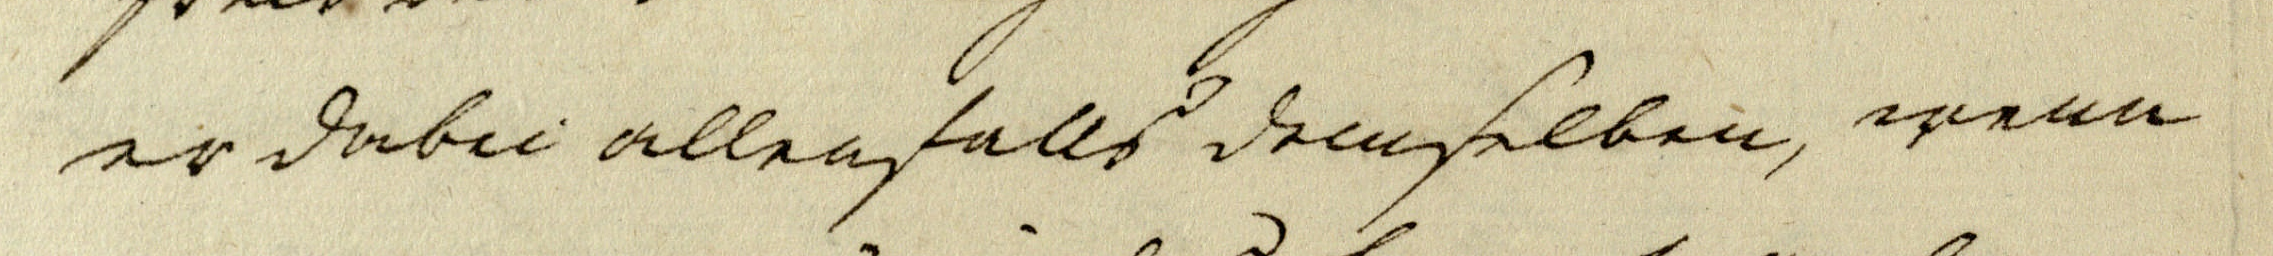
er dabei allenfalls demselben, wenn
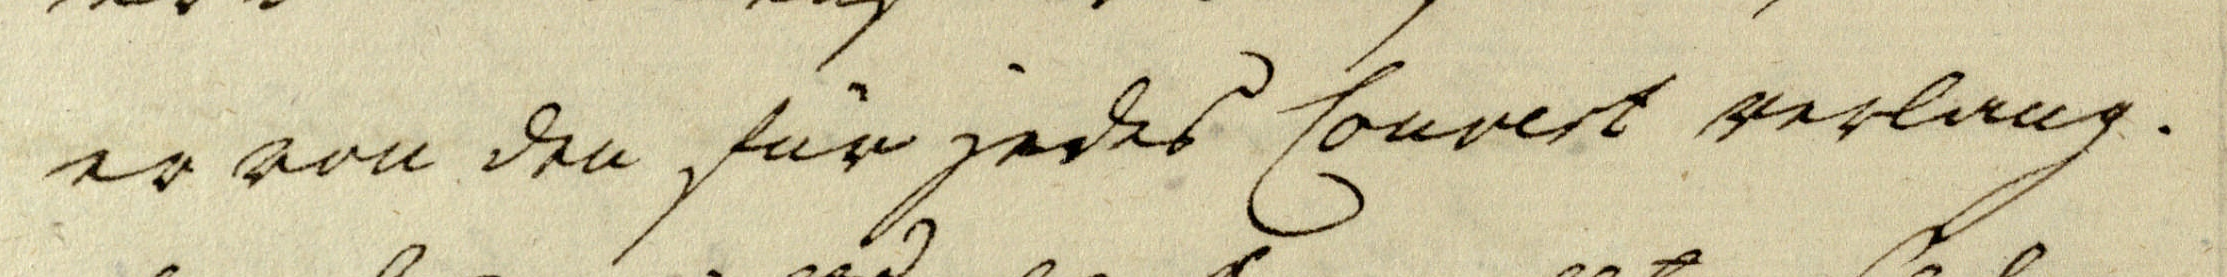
er von den für jedes Couvert verlang¬
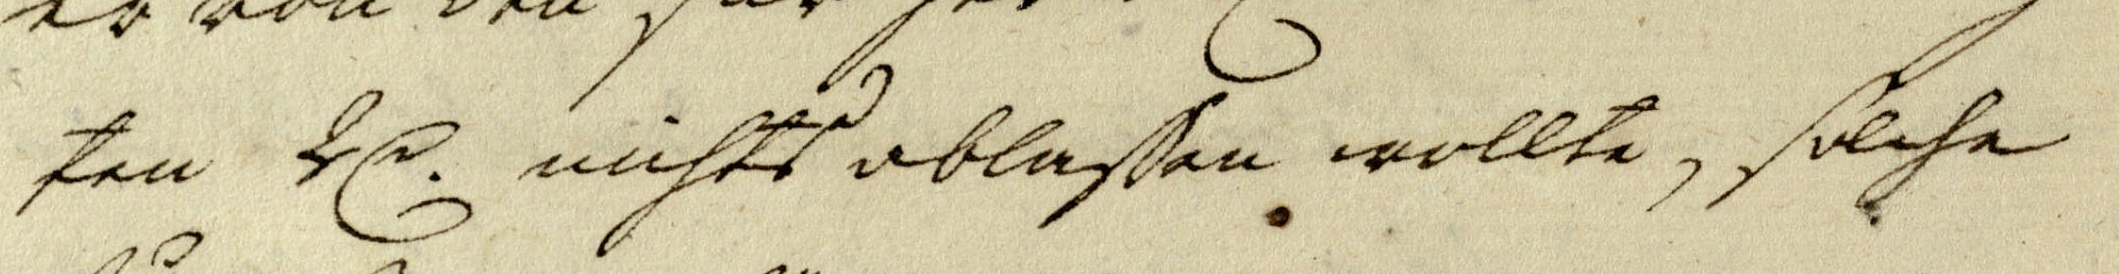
ten 2 l. nichts ablassen wollte, solche
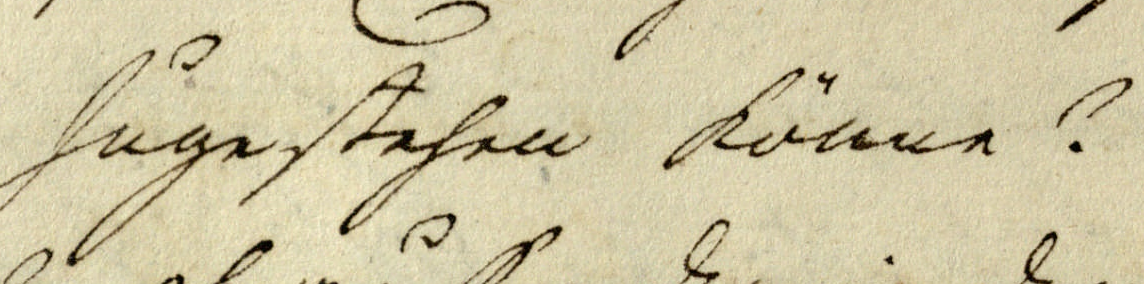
zugestehen könne?
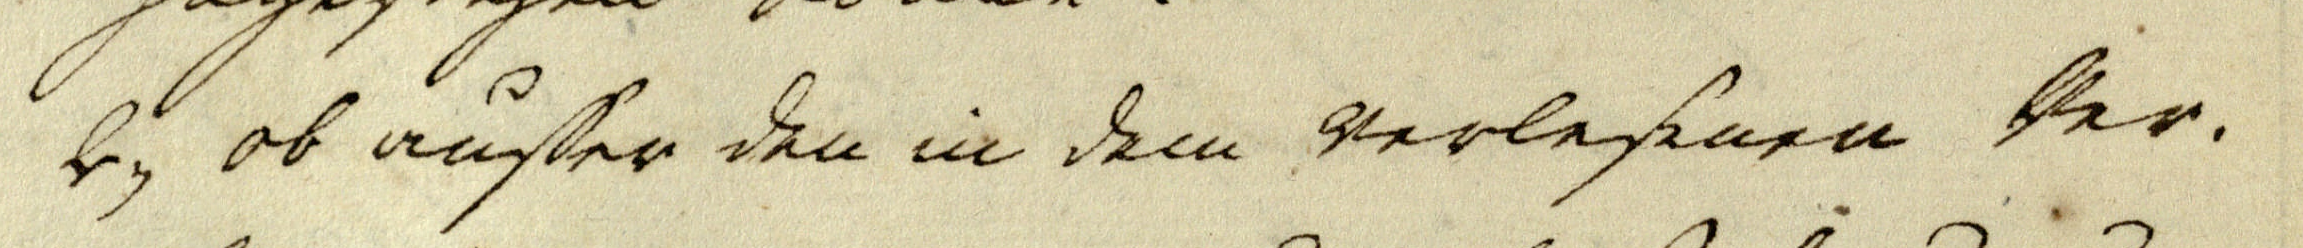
2; ob ausser den in dem verlesenen Ver¬
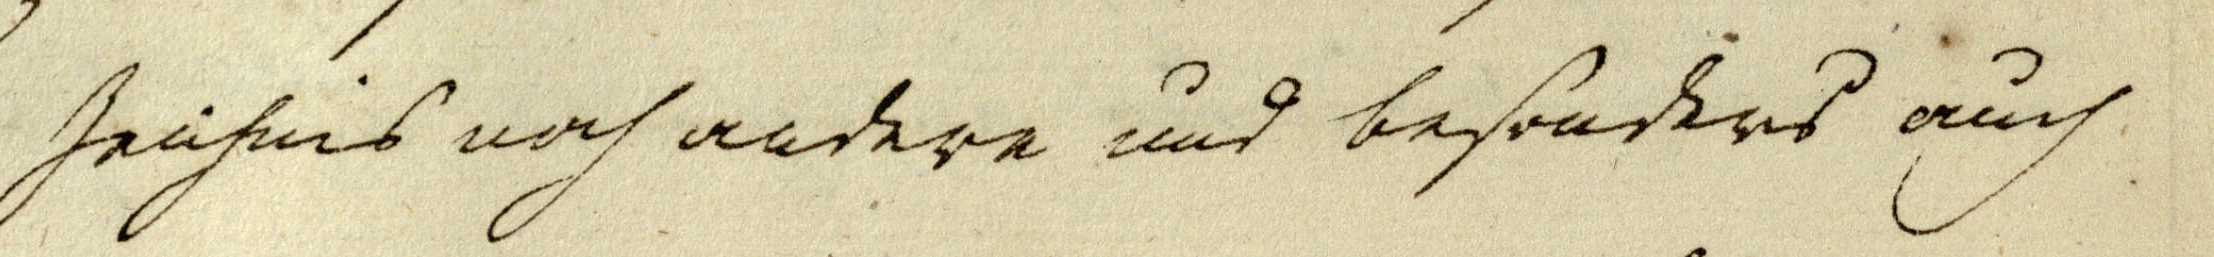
zeichnis noch andere und besonders auch
